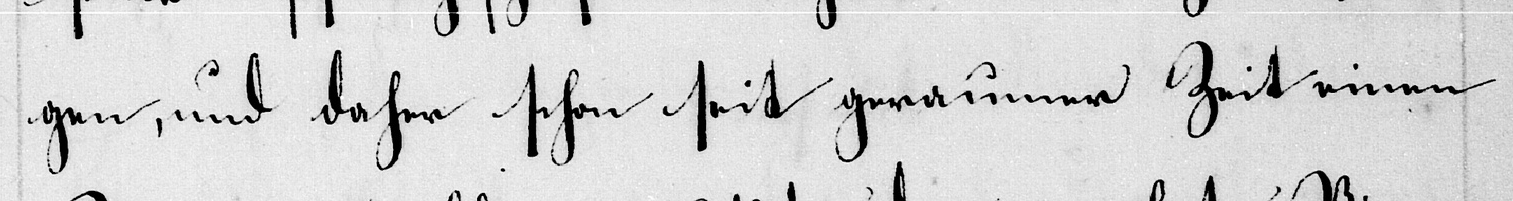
gen, und daher schon seit geraumer Zeit einen
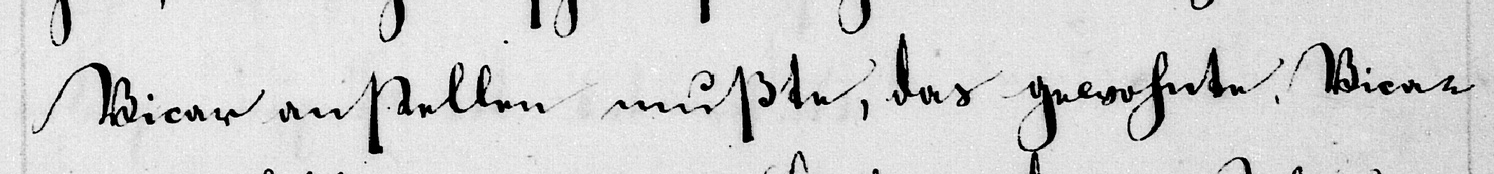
Vicar anstellen müßte, das gewohnte Vica¬
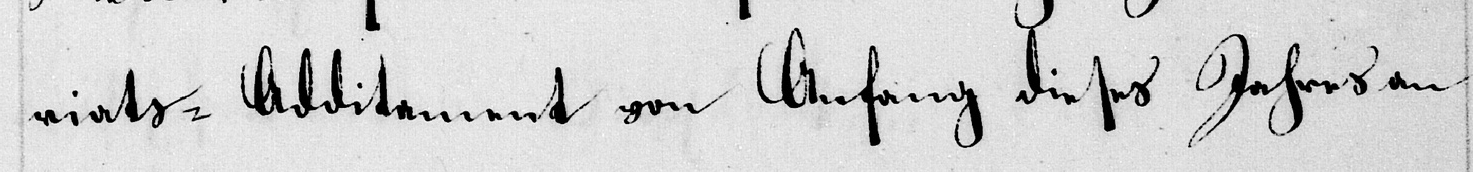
riats-Additament von Anfang dieses Jahres an
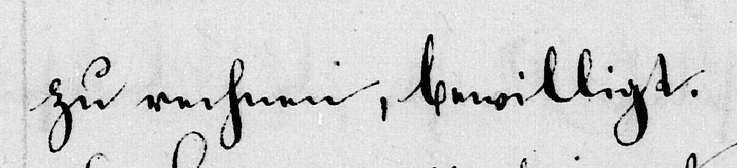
zu rechnen, bewilligt.
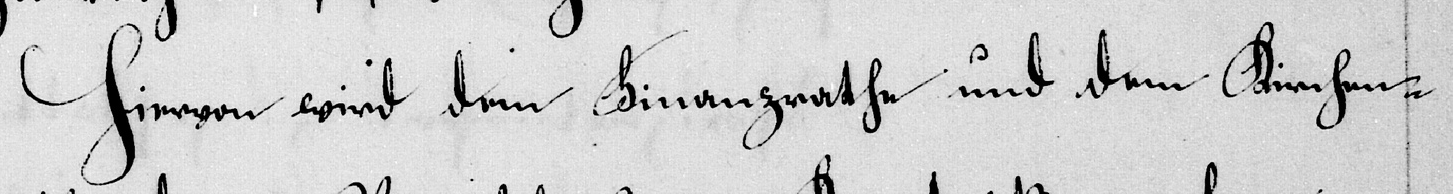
Hiervon wird dem Finanzrathe und dem Kirchen¬
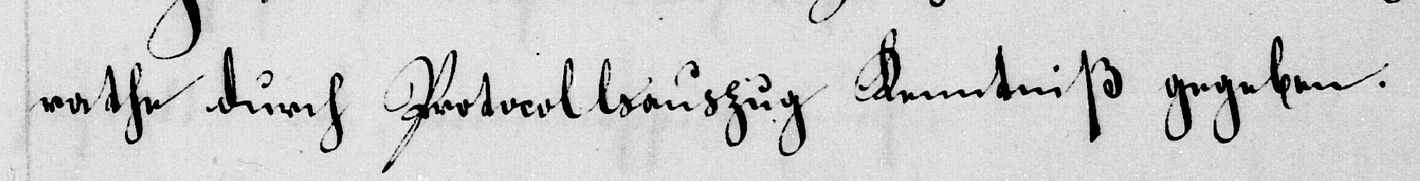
rathe durch Protocollsauszug Kenntniß gegeben.
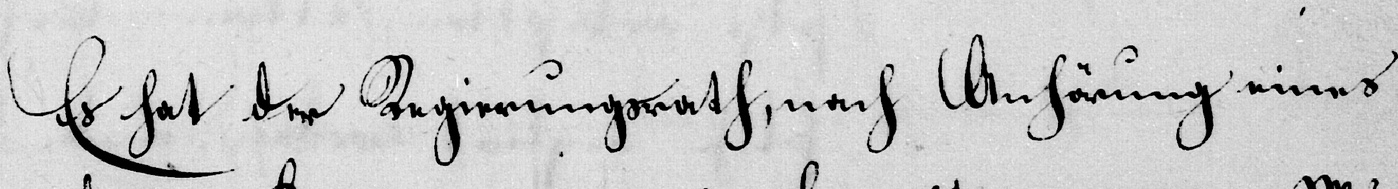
Es hat der Regierungsrath, nach Anhörung eines
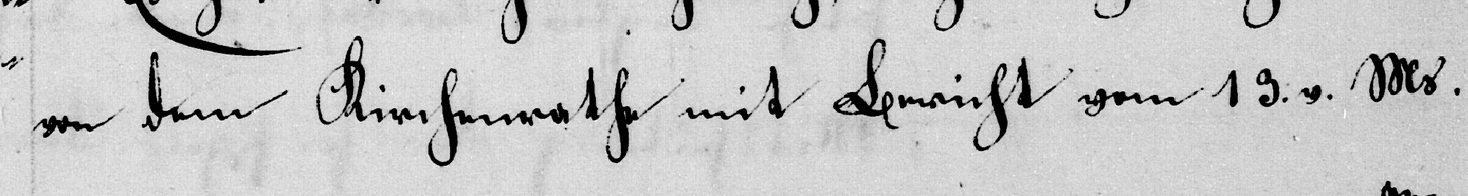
von dem Kirchenrathe mit Bericht vom 13. v. Ms.
